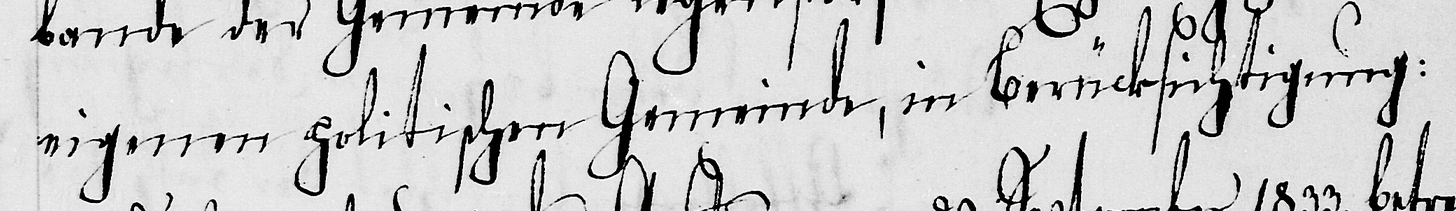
eigenen politischen Gemeinde, in Berücksichtigung:
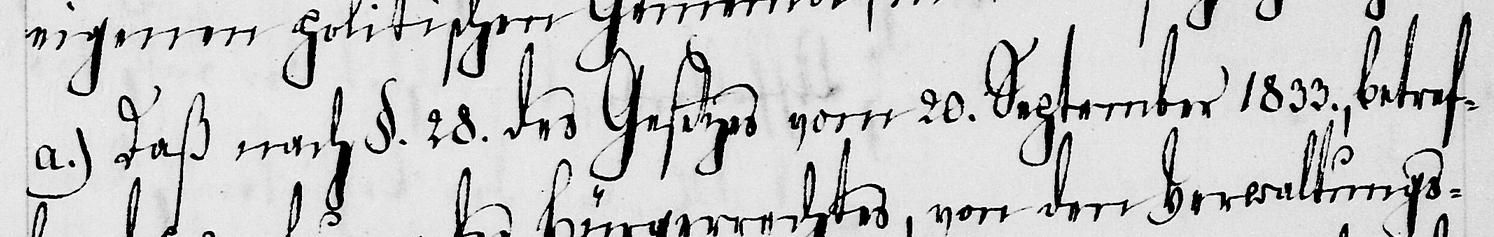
a.) Daß nach §. 28. des Gesetzes vom 20. September 1833., betr¬
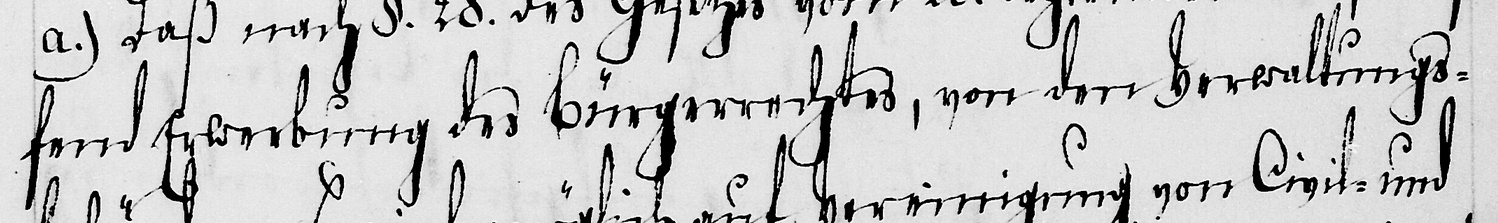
fend Erwerbung des Bürgerrechtes, von den Verwaltungs¬
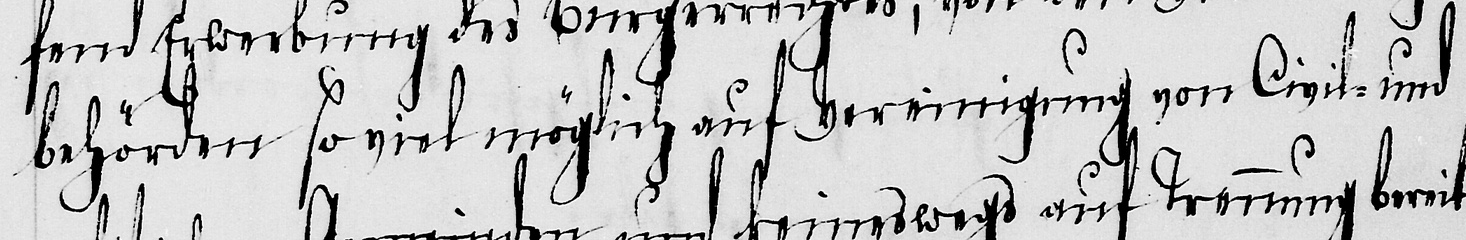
behörden so viel möglich auf Vereinigung von Civil- und
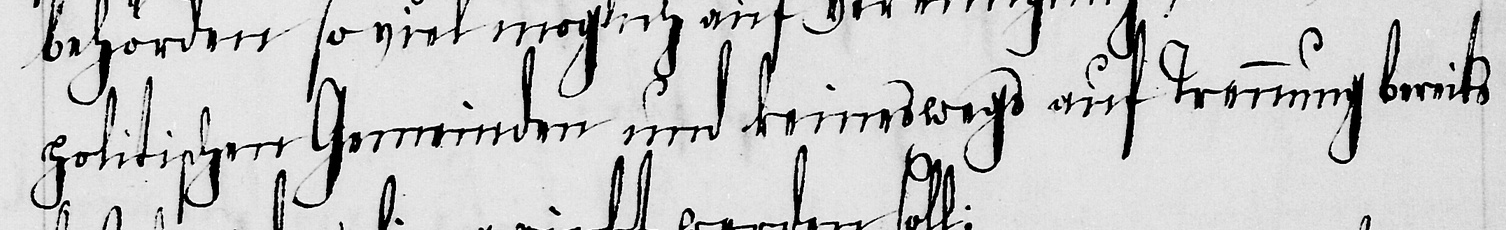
politischen Gemeinden und keineswegs auf Trennung bereits
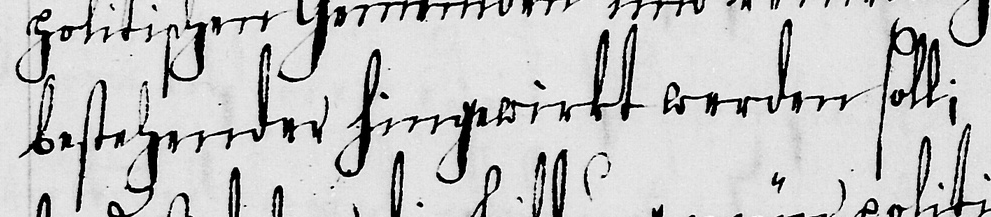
bestehender hingewirkt werden soll;
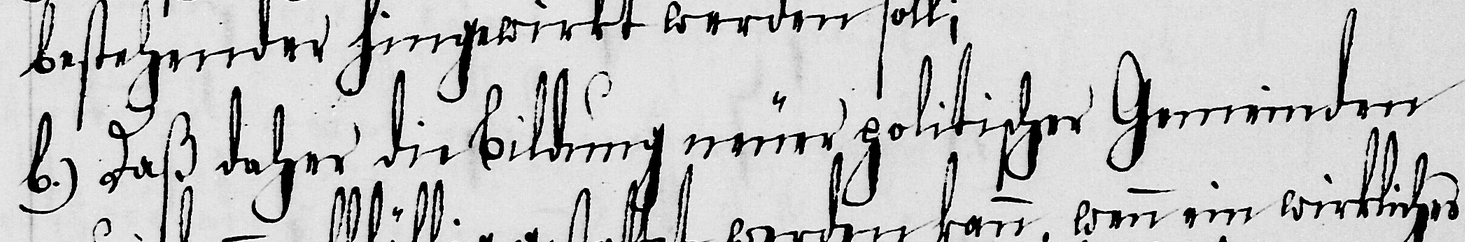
b.) Daß daher die Bildung neuer politischer Gemeinden
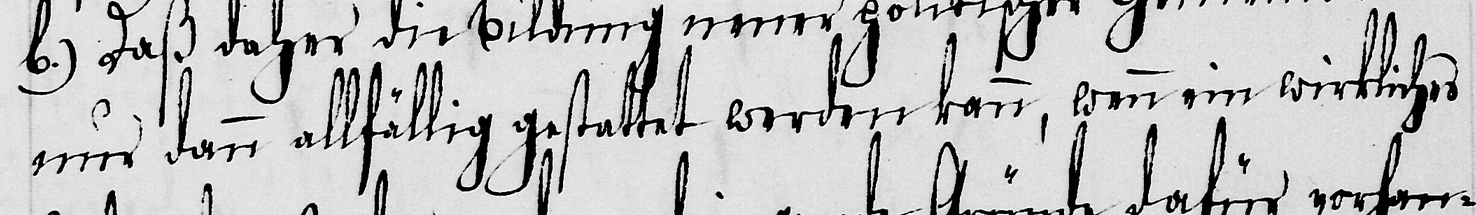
nur dann allfällig gestattet werden kann, wenn ein wirkliches
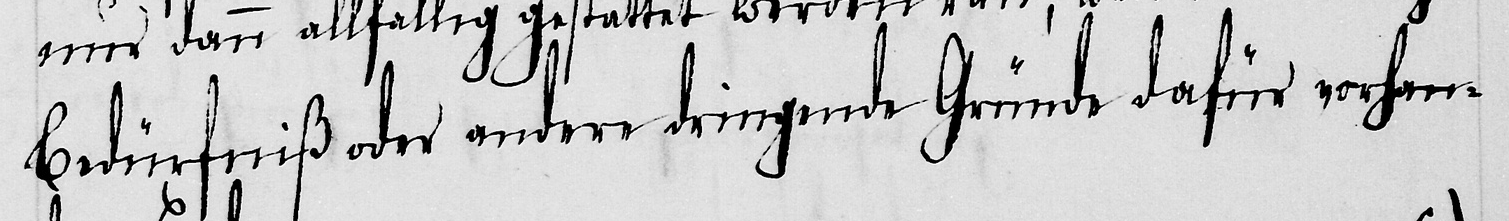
Bedürfniß oder andere dringende Gründe dafür vorhan¬
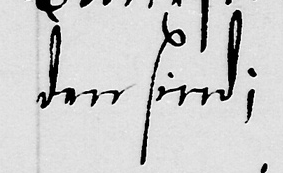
den sind;
